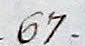67
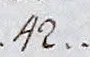42
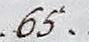65
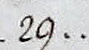29
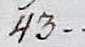43
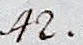42
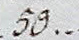50
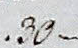30
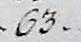63
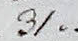31
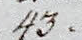43
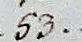53
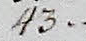43
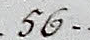56
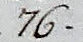76
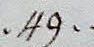49
